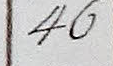46
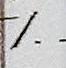1.
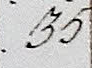35
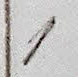1
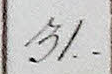31.
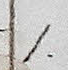1
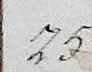25
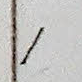1
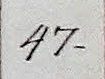47-
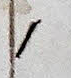1
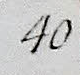40
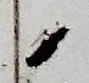7
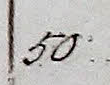50
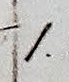1
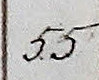55
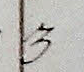3
